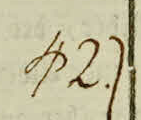42.
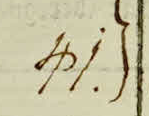41.
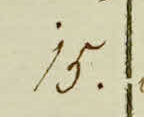15.
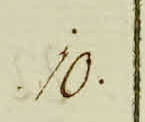10.
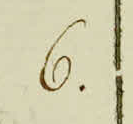6.
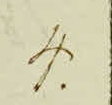4.
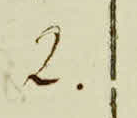2.
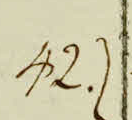42.
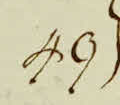49.
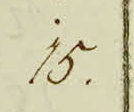15.
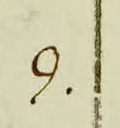9.
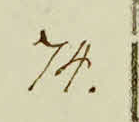74.
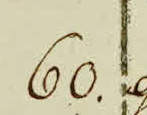60.
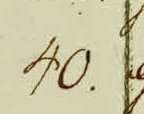40.
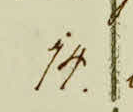14.
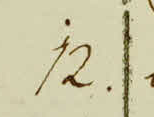12.
